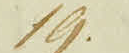19.
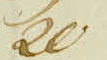20
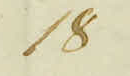18
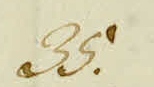35.
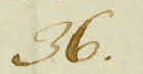36.
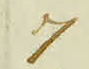7
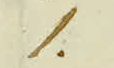1.
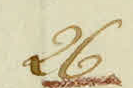26
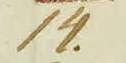14.
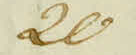20
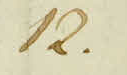12.
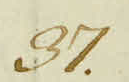37.
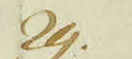29.
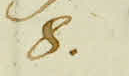8.
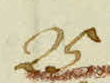25.
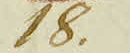18.
